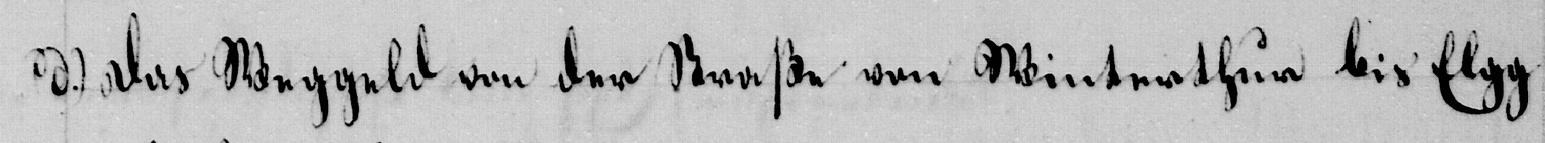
d.) Das Weggeld von der Straße von Winterthur bis Elgg
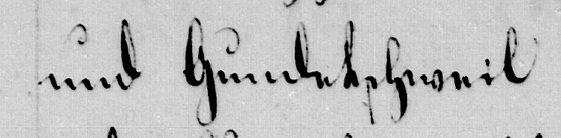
und Gundetschweil
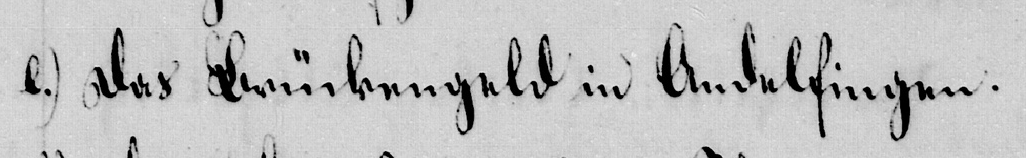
e.) Das Brückengeld in Andelfingen.
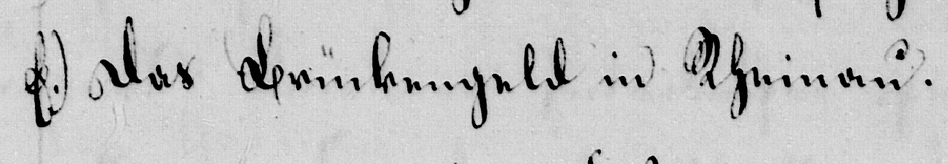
f.) Das Brückengeld in Rheinau.
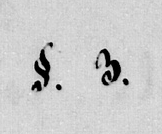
§. 3.
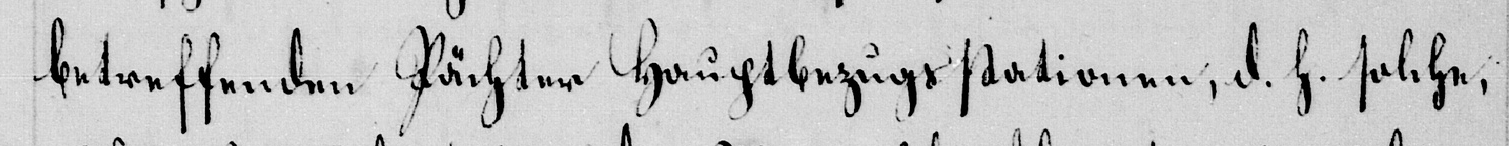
betreffenden Pächter Hauptbezugsstationen, d. h. solche,
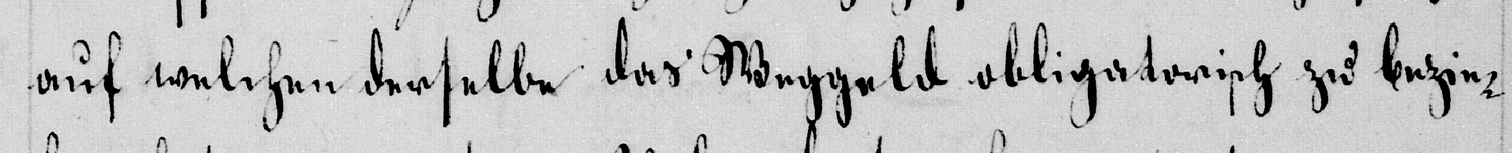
auf welchen derselbe das Weggeld obligatorisch zu bezie¬
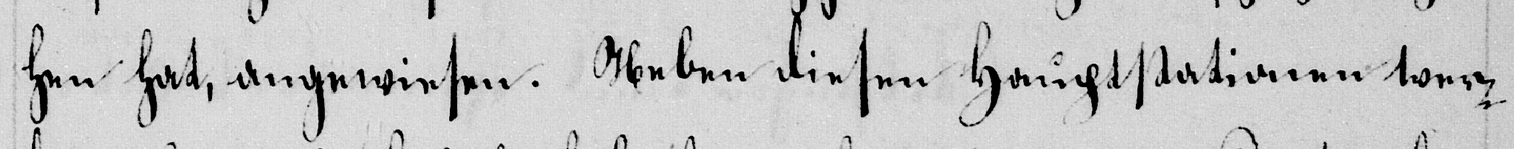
hen hat, angewiesen. Neben diesen Hauptstationen wer¬
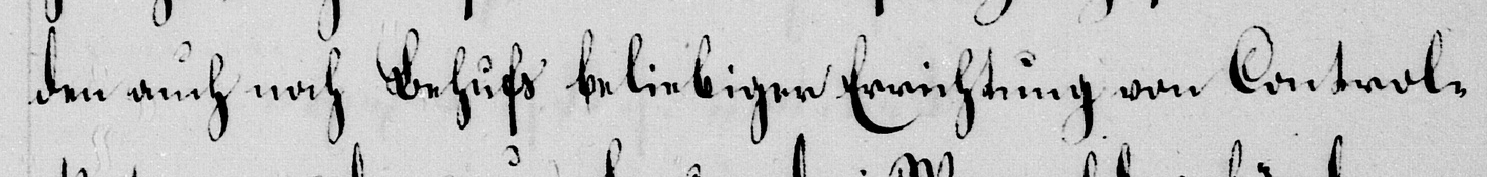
den auch noch Behufs beliebiger Einrichtung von Control¬
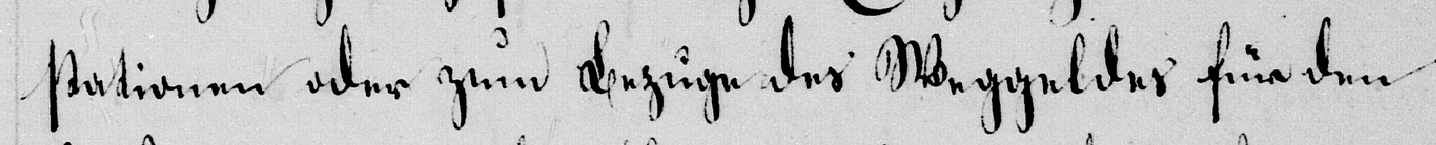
stationen oder zum Bezuge des Weggeldes für den
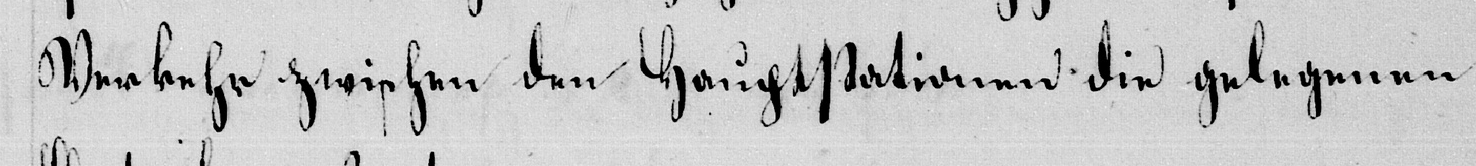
Verkehr zwischen den Hauptstationen die gelegenen
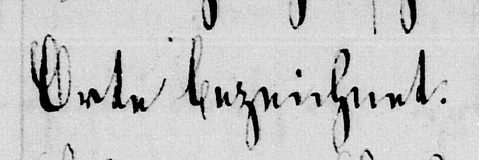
Orte bezeichnet.
